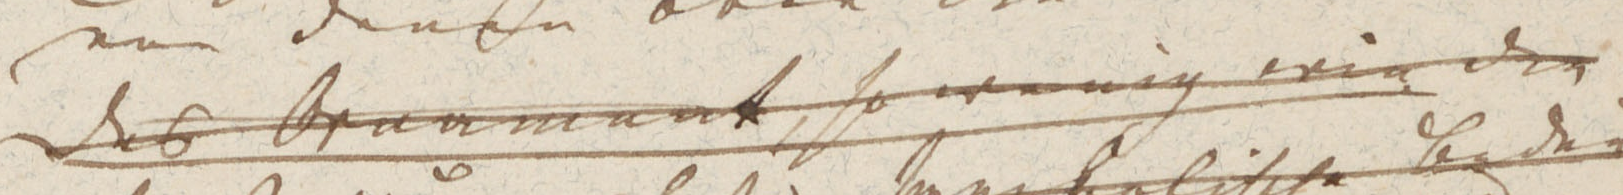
Das Ornament, so wenig wie die
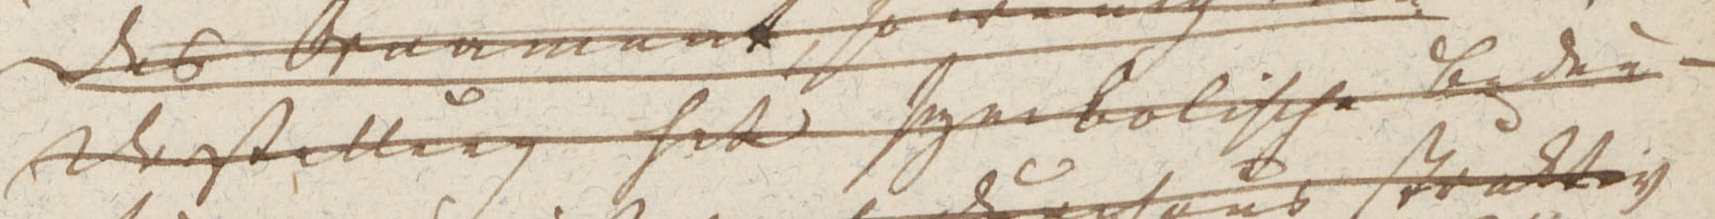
Darstellung hat symbolische Bedeu-
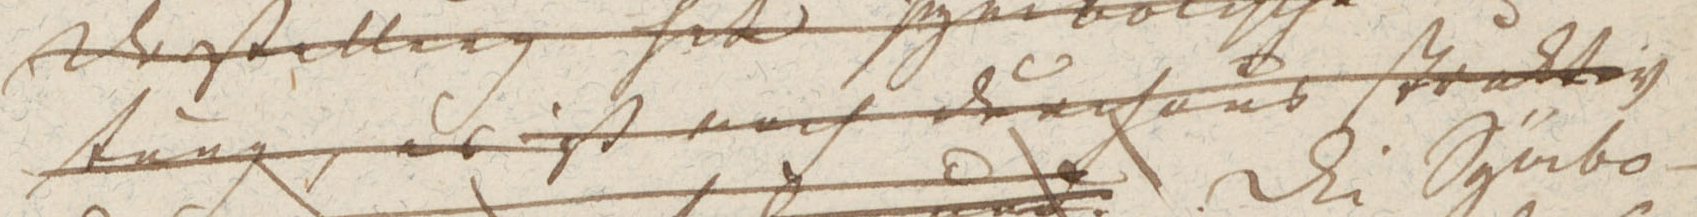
tung, es ist noch durchaus struktiv
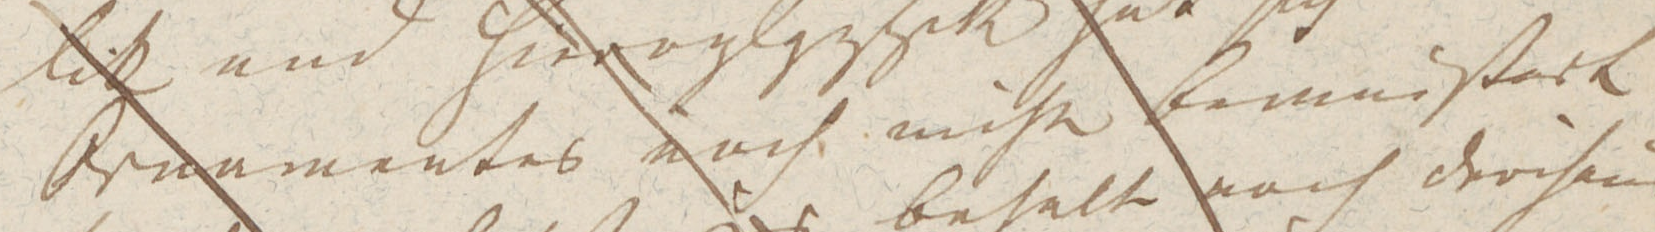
Ornamentes noch nicht bemeistert
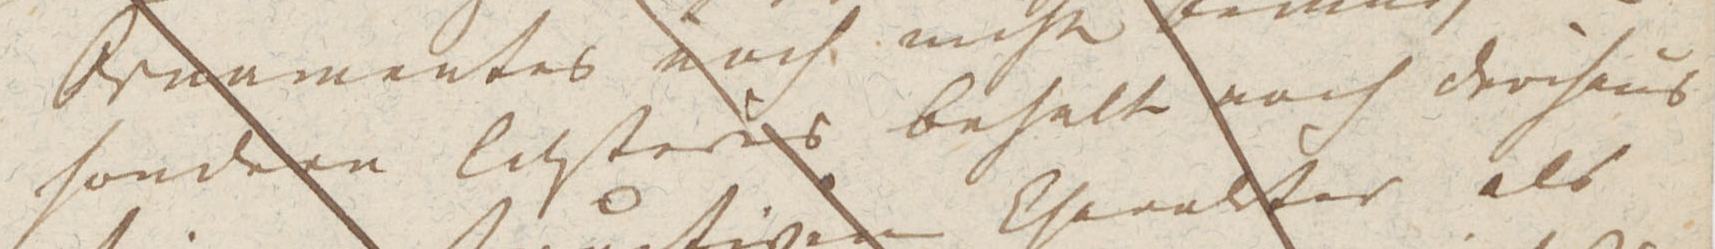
sondern letzteres behalt noch durchaus
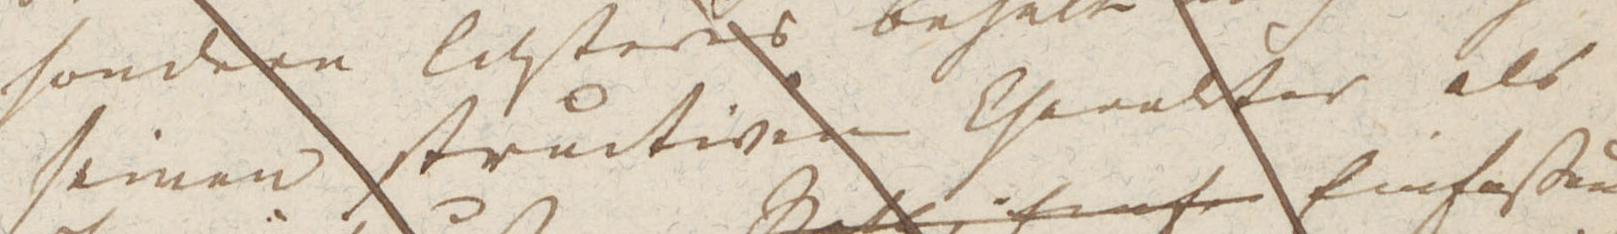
seinen structiven Charakter als
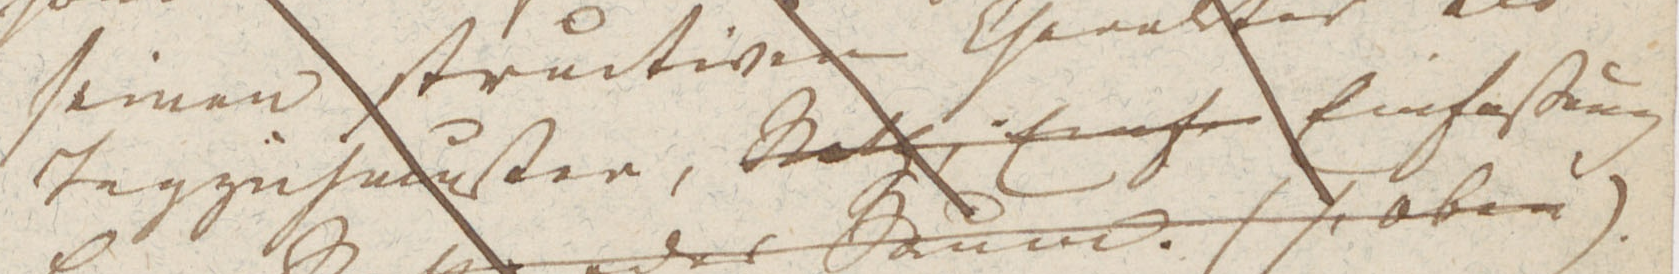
Teppichmuster, Nath, Einf Einfassung
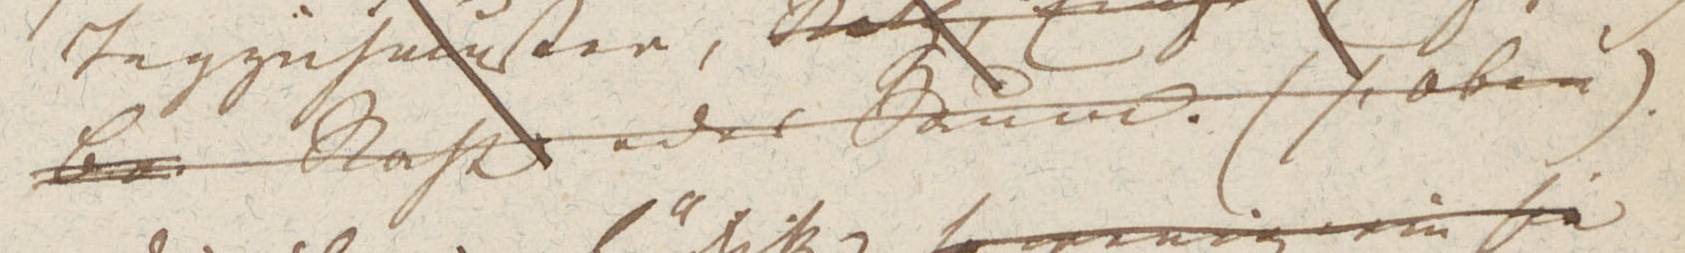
B Naht oder Saum. (s. oben).
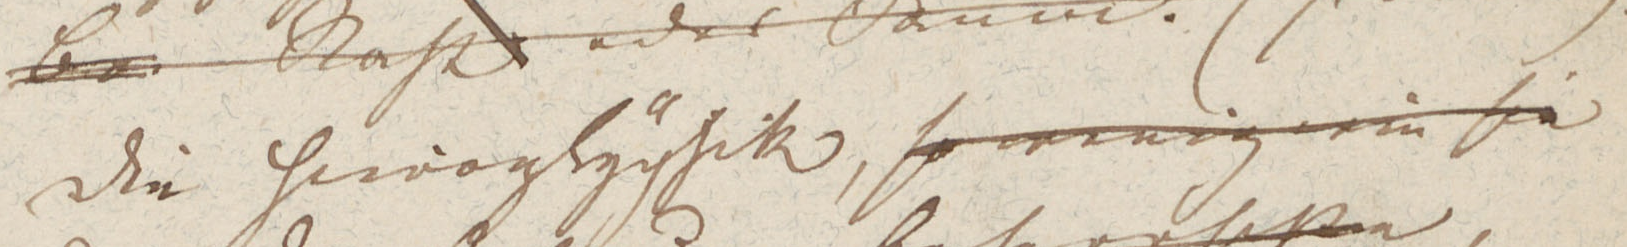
Die Hieroglyphik, so wenig wie sie
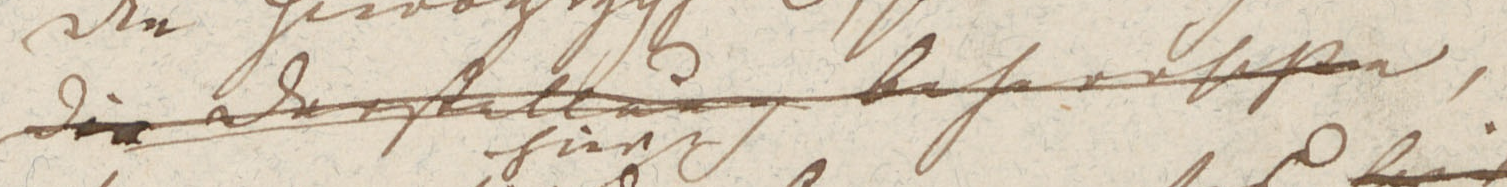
die Darstellung beherrschte,
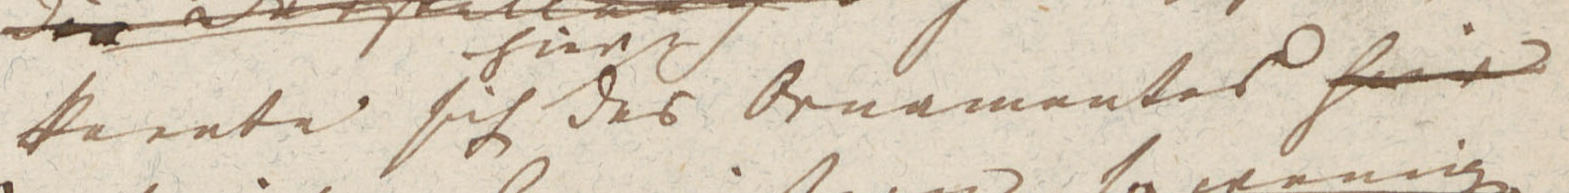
konnte sich hier des Ornamentes hier
